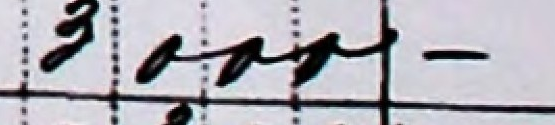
3000 -
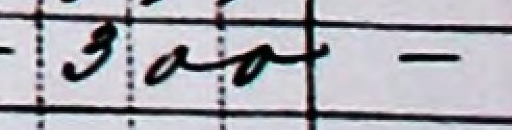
300 -
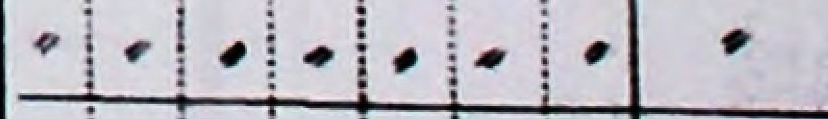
„ „ „ „ „ „ „ „
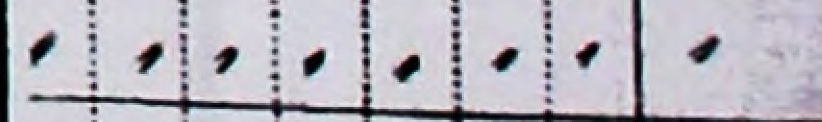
„ „ „ „ „ „ „ „
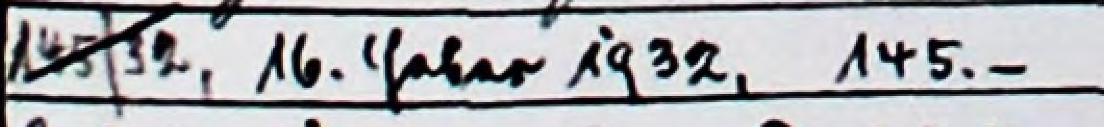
145/32, 16. Feber 1932, 145.-
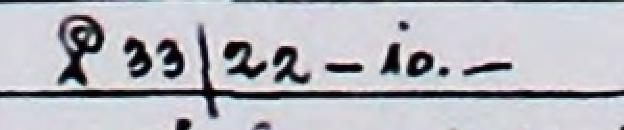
P 33/22-10.-
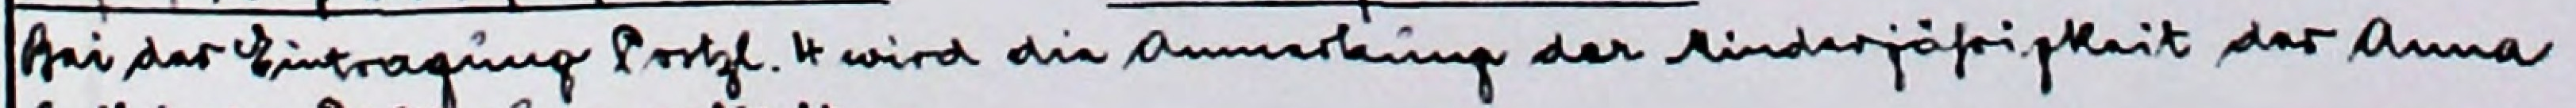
Bei der Eintragung Postzl. 4 wird die Anmerkung der Einderjährigkeit des Anna
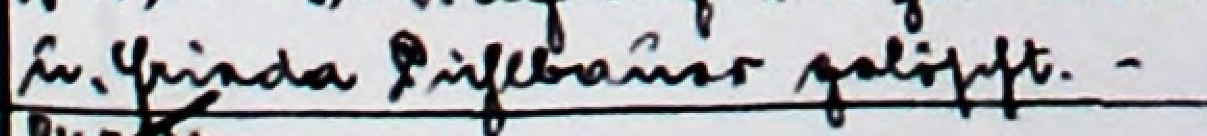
u. Frieda Pichlbauer gelöscht.-
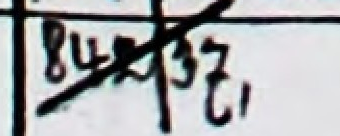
842/37,
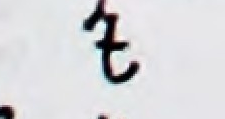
7
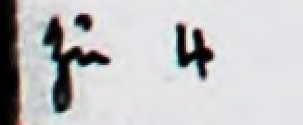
Zu 4
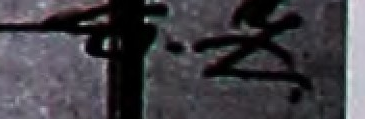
E. Z.
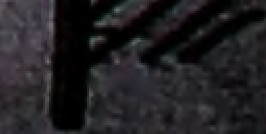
1111
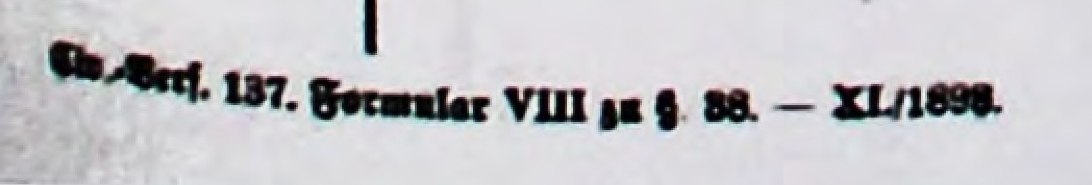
Ein=???. 137. Formular VIII zu § 38. - XL/1898.
